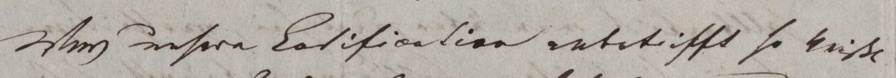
Was unsere Codification anbetrifft so weißt
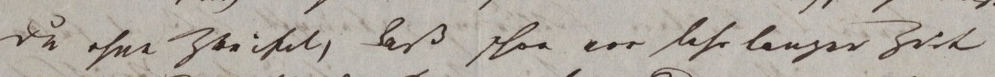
Du ohne Zweifel, daß schon vor sehr langer Zeit
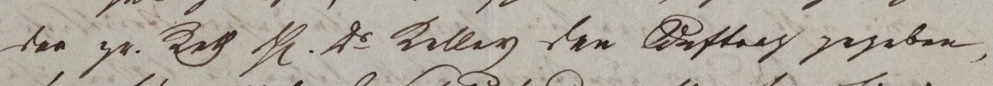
der gr. Rath H. DrKeller den Auftrag gegeben,
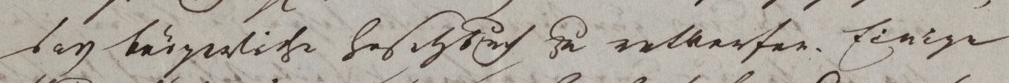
das bürgerliche Gesetzbuch zu entwerfen. Einige
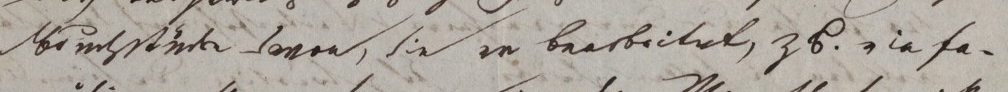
Bruchstücke davon, die er bearbeitet, zB. ein Fa-
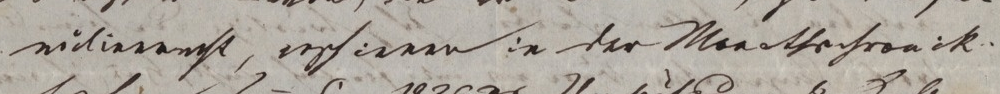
milienrecht, erschienen in der Monathschronik.
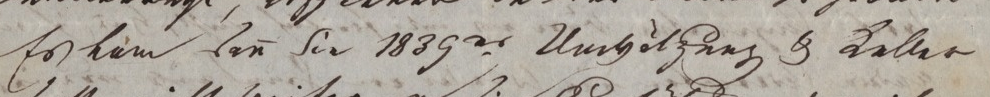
Es kam dann die 1839er Umwälzung & Keller
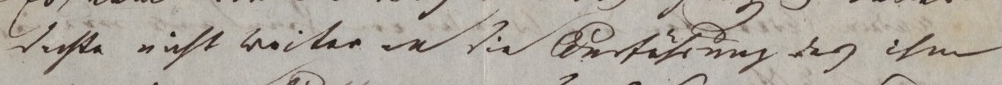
dachte nicht weiter an die Ausführung des ihm
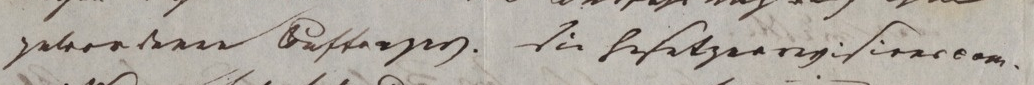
gewordenen Auftrages. Die Gesetzesrevisionscom-
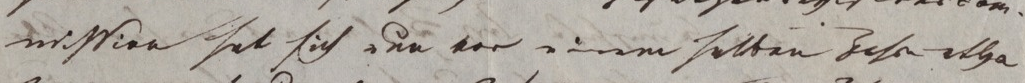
mission hat sich nun vor einem halben Jahre etwa
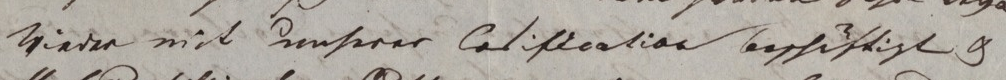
wieder mit unserer Codification beschäftigt &
